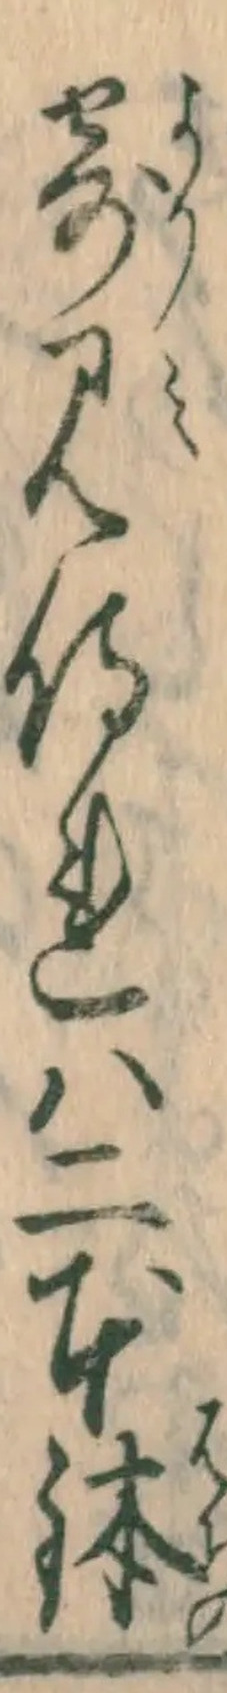寄見侍れは二本鉢
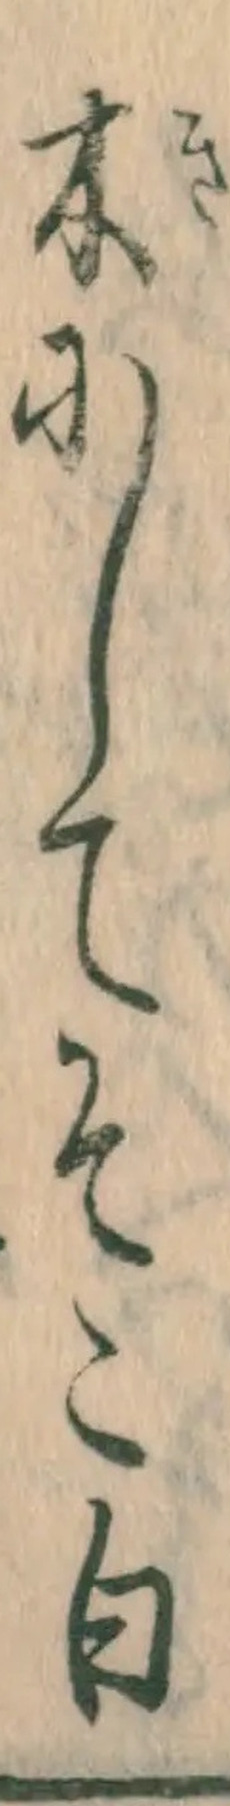木にしてそこ白
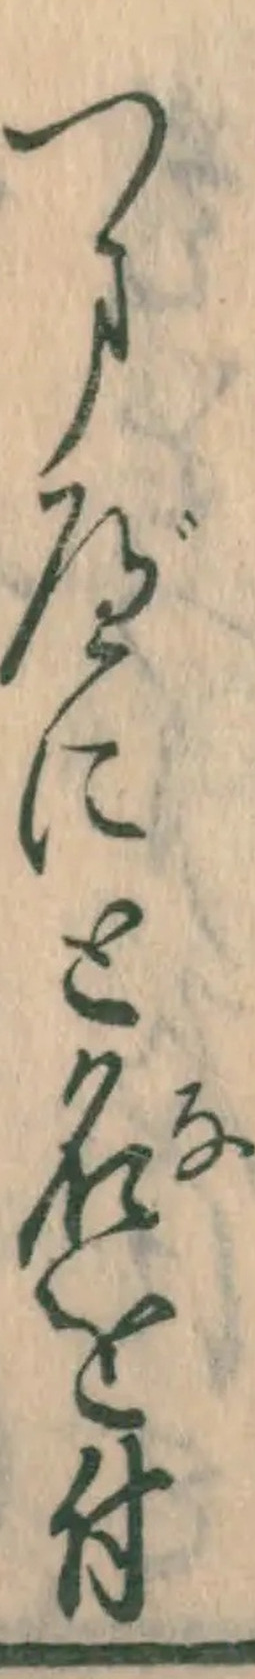つまべにと名を付
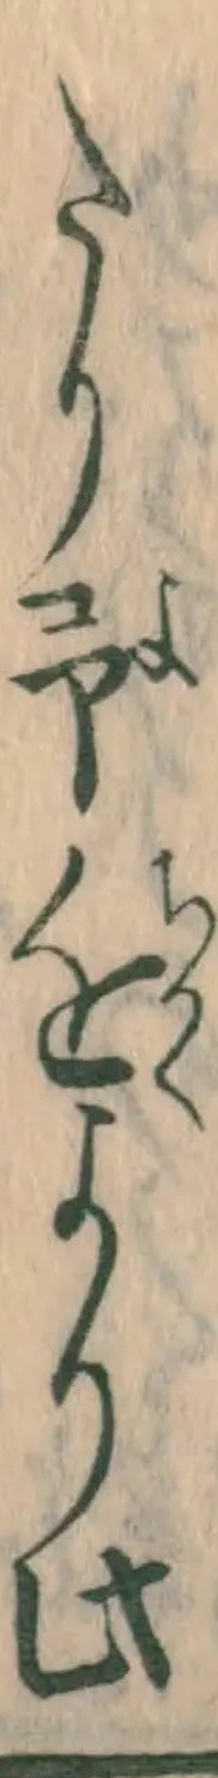たり予近より此
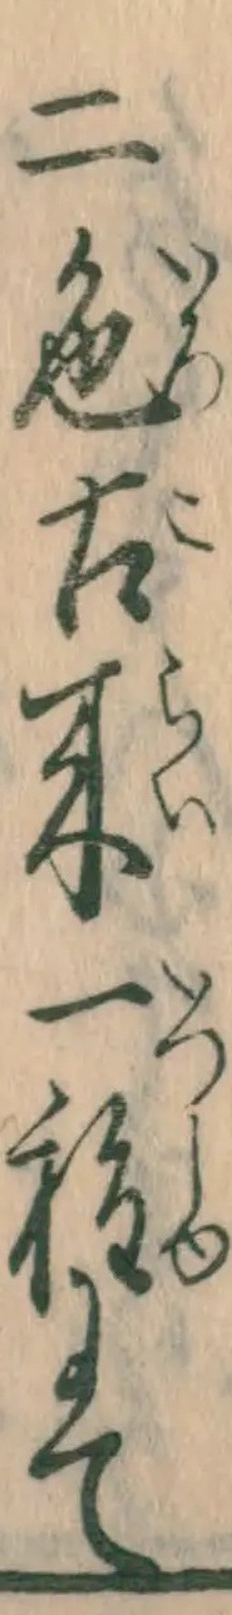二色古来一種にて
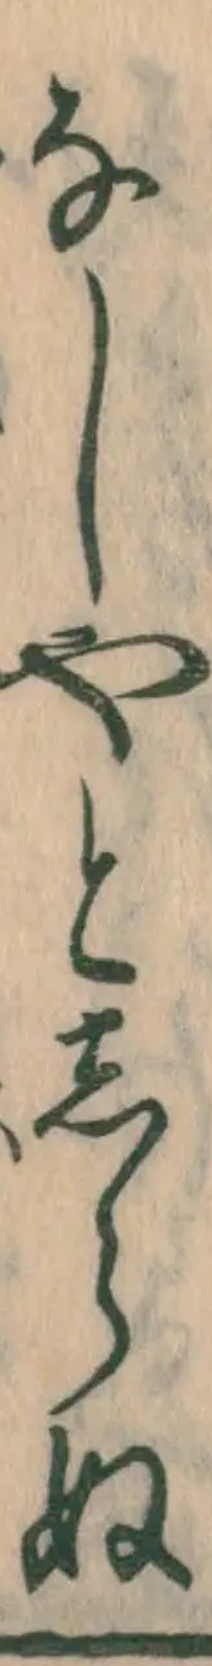なしやとしらぬ
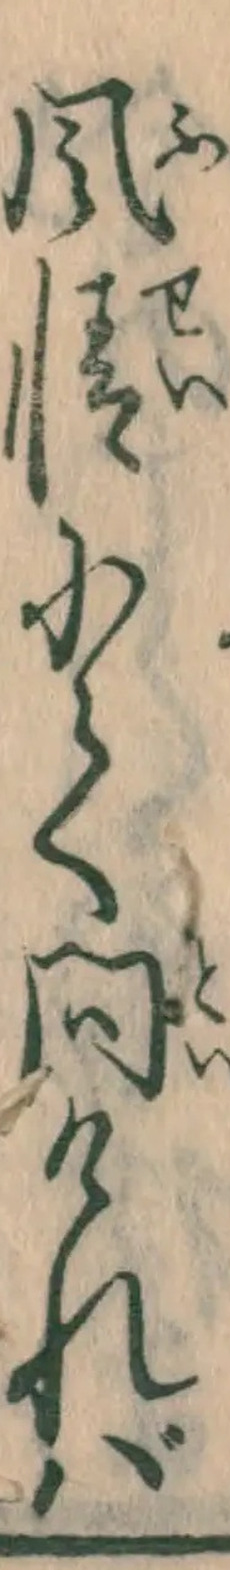風情にて問ければ
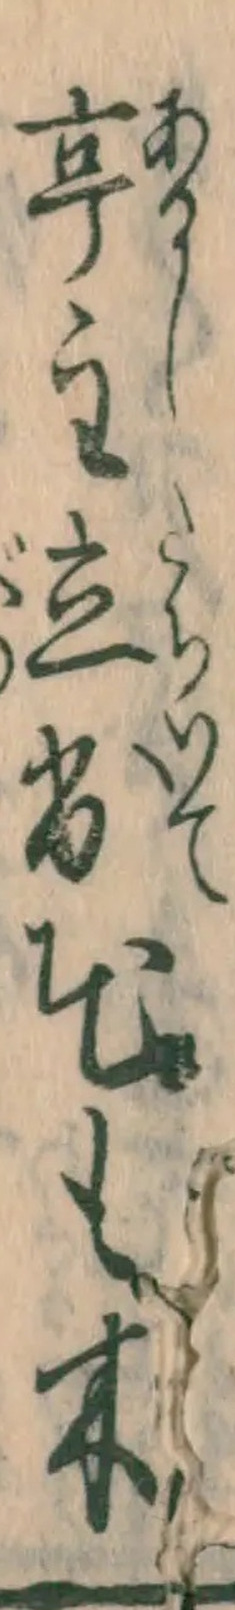亭主立出花も木
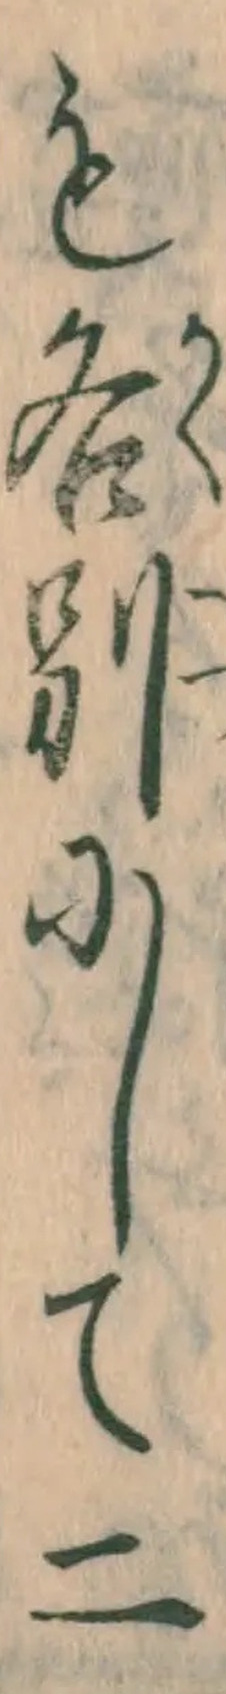も各別にして二
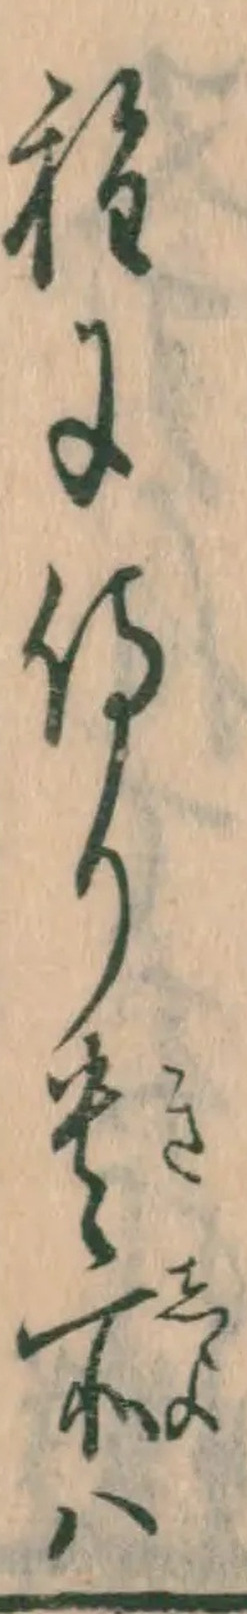種に侍り貴所は
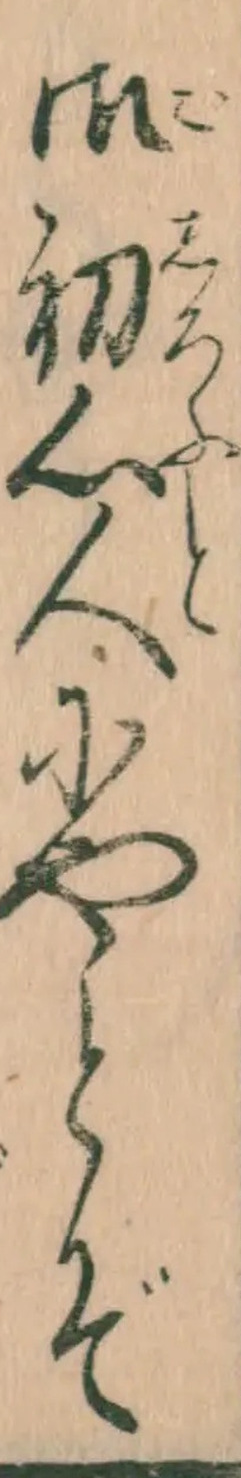御初心人にやとぞ
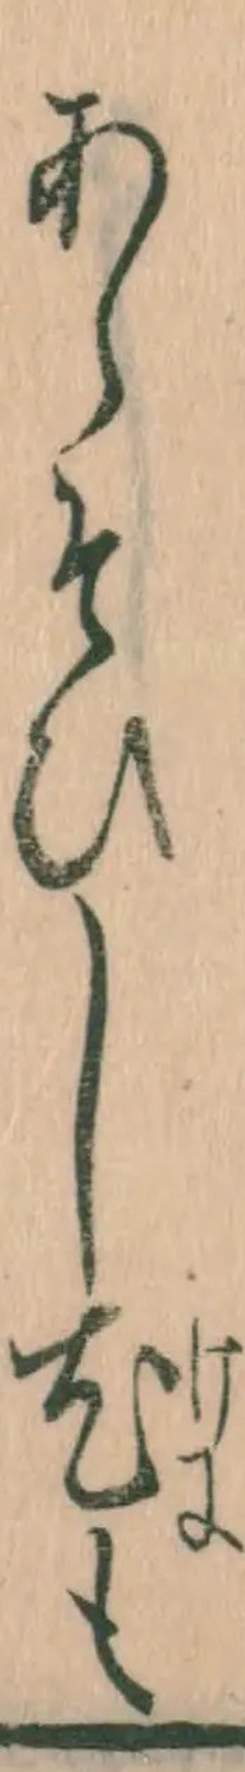あらそひし尤も
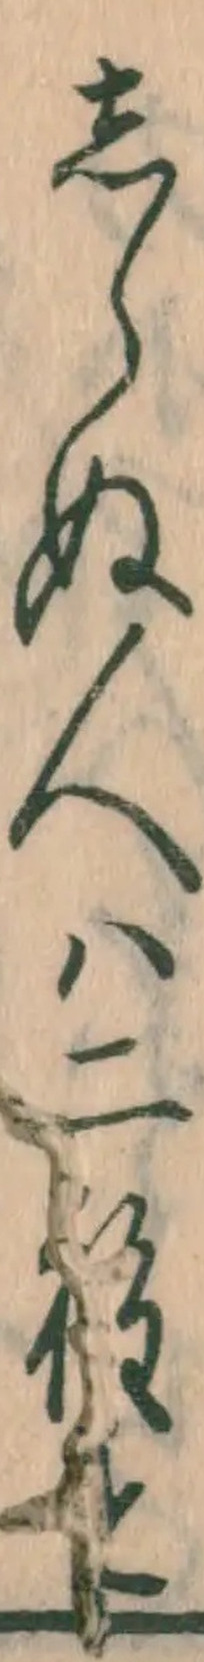しらぬ人は二種と
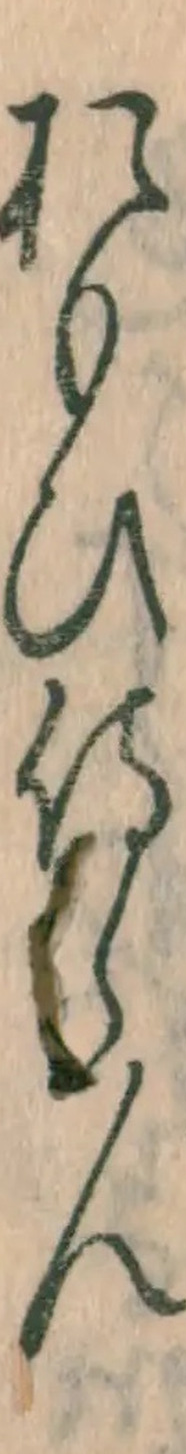おもひ侍らん
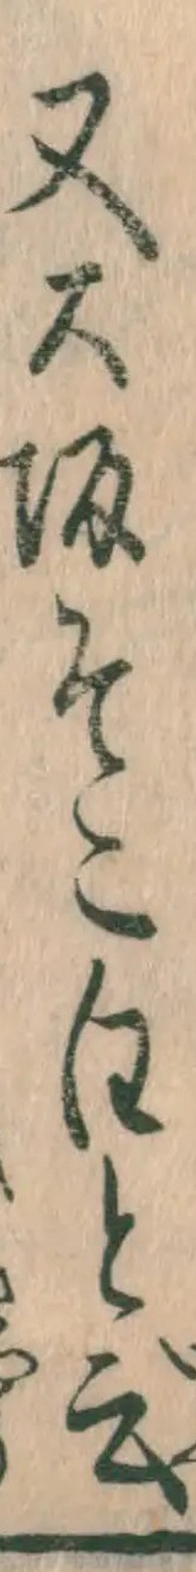又大坂そこ白と云
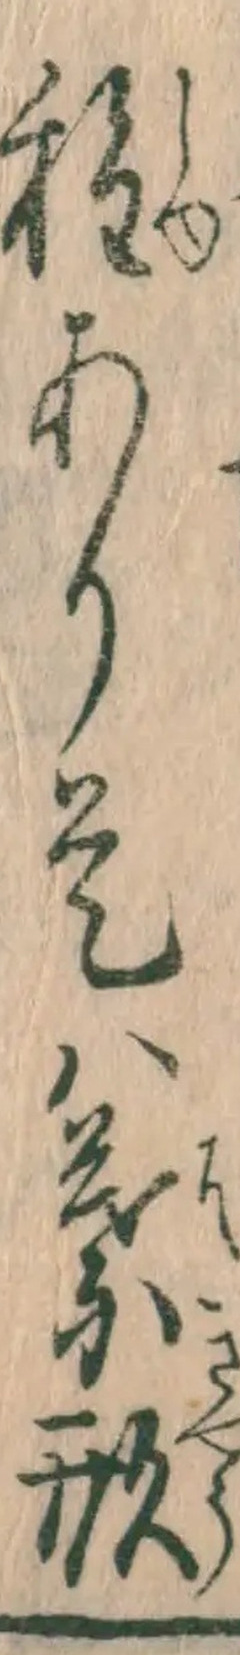種あり是は葉形
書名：錦繍枕 5巻. [4]
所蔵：国立国会図書館 National Diet Library, JAPAN
